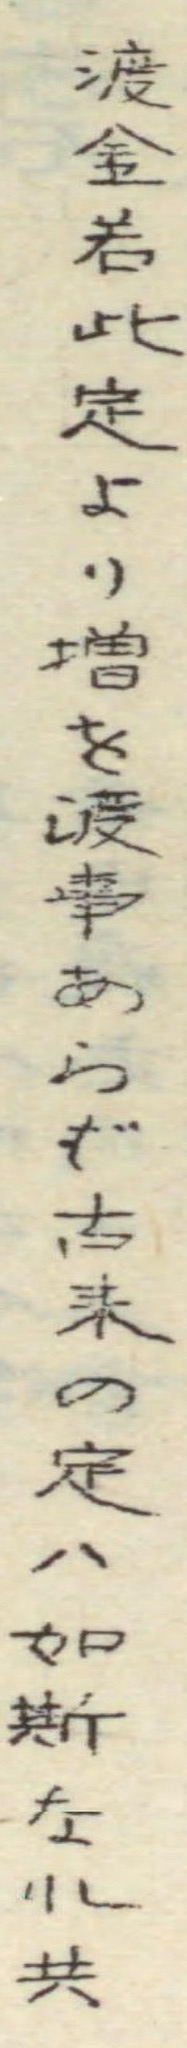渡金者此定より増を渡事あらず古来の定ハ如斯なれ共
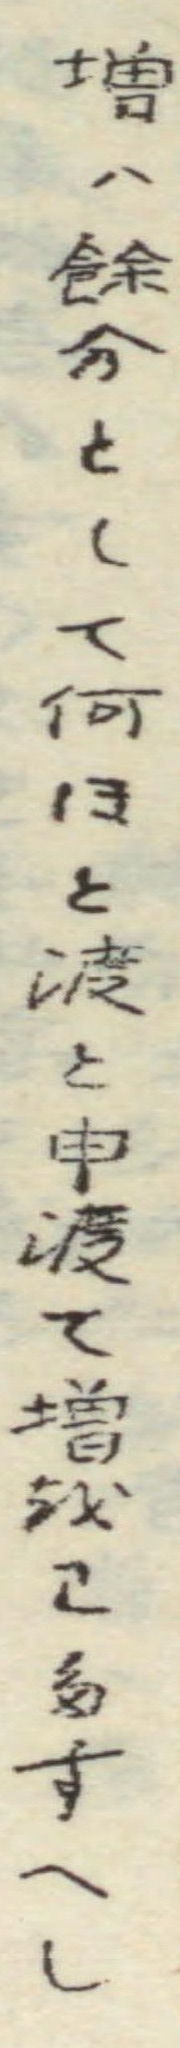増ハ余分として何ほど渡と申渡て増をわたすへし
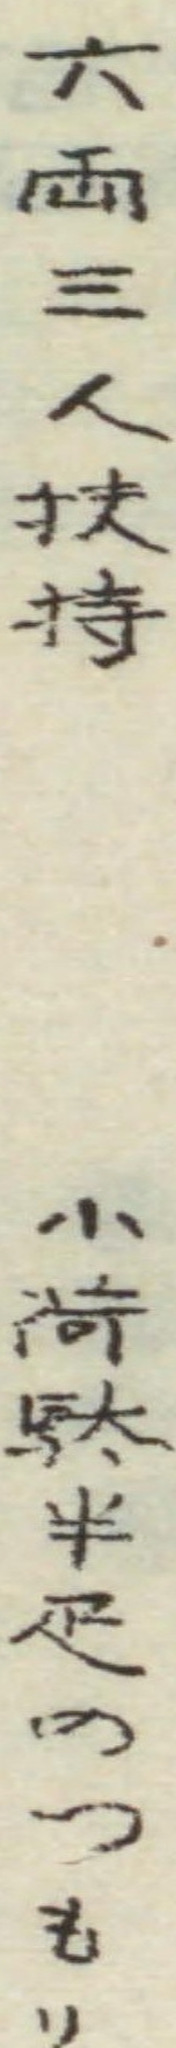六両三人扶持小荷駄半疋のつもり
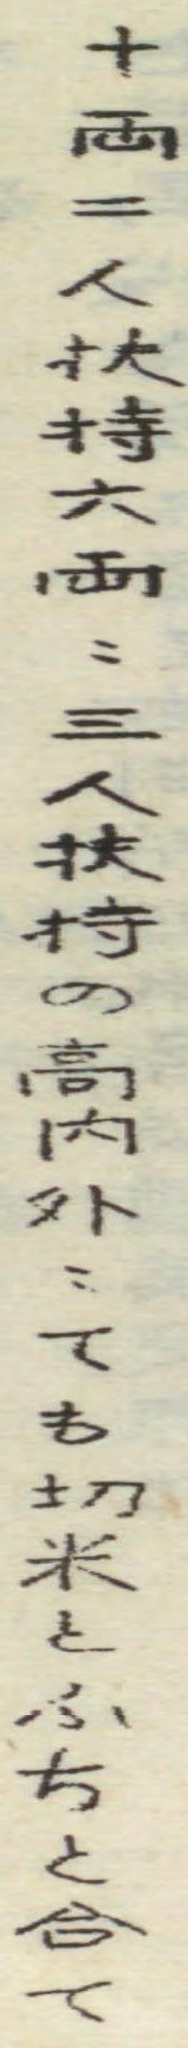十両二人扶持六両二三人扶持の高内外にても切米とふちと合て
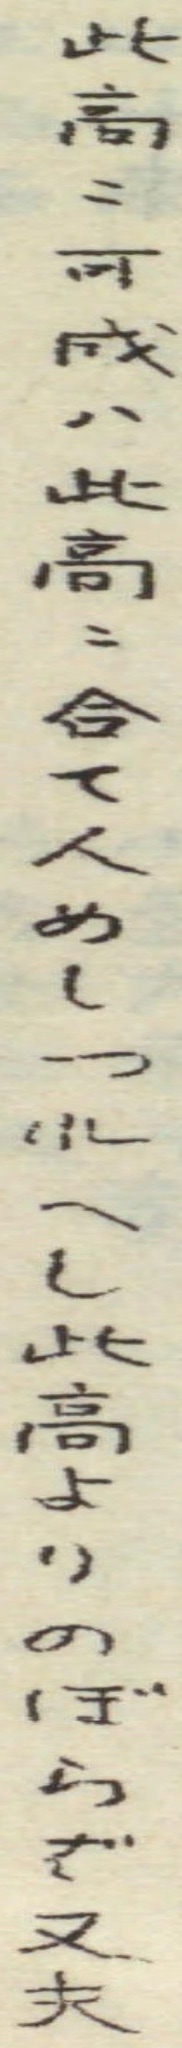此高二可成ハ此高二合て人めしつれへし此高よりのぼらで又夫
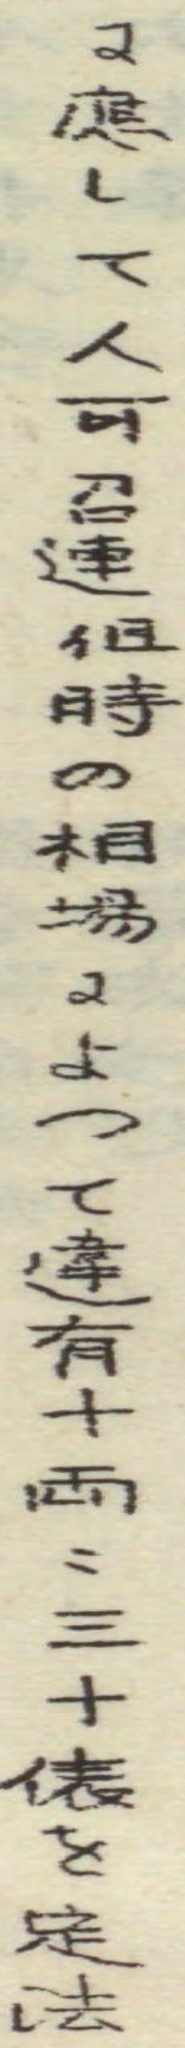に応して人可召連但時の相場によつて違有十両二三十俵を定法
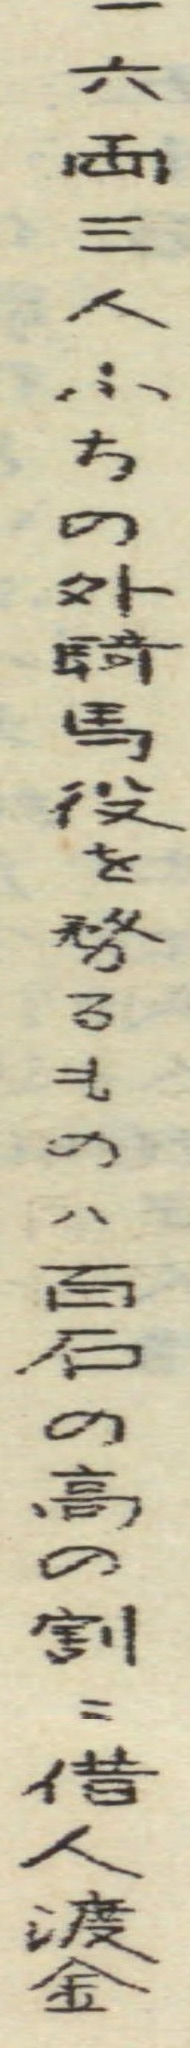一六両三人ふちの外騎馬役を務るものハ百石の割二借人渡金
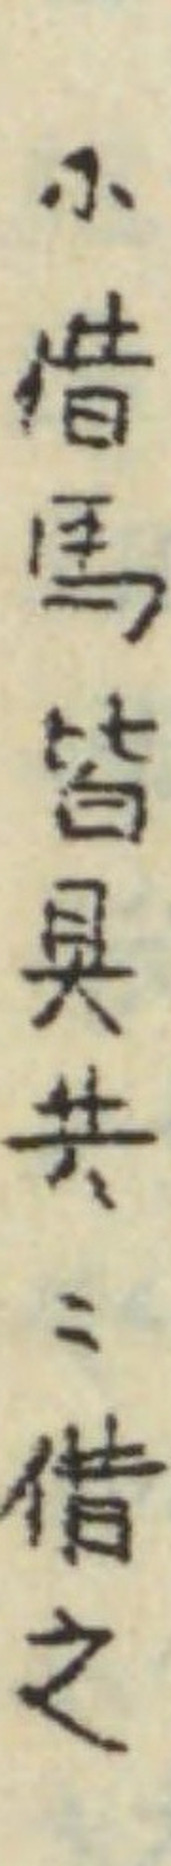等借馬皆具共二借之

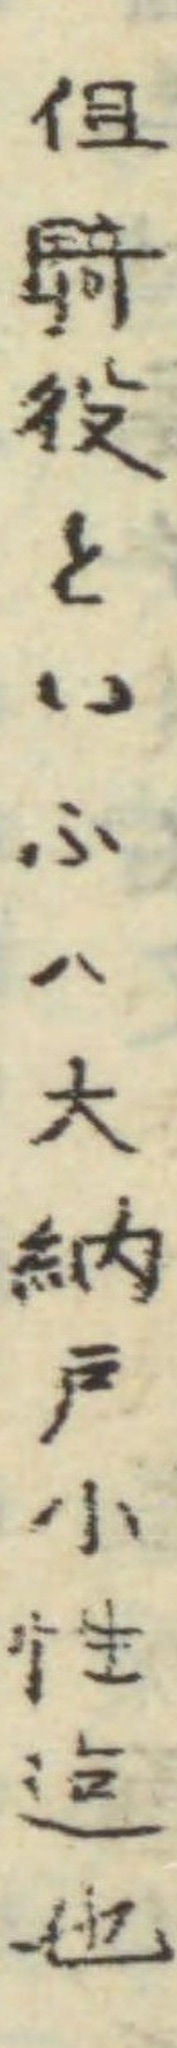但騎役といふハ大納戸小姓迄也
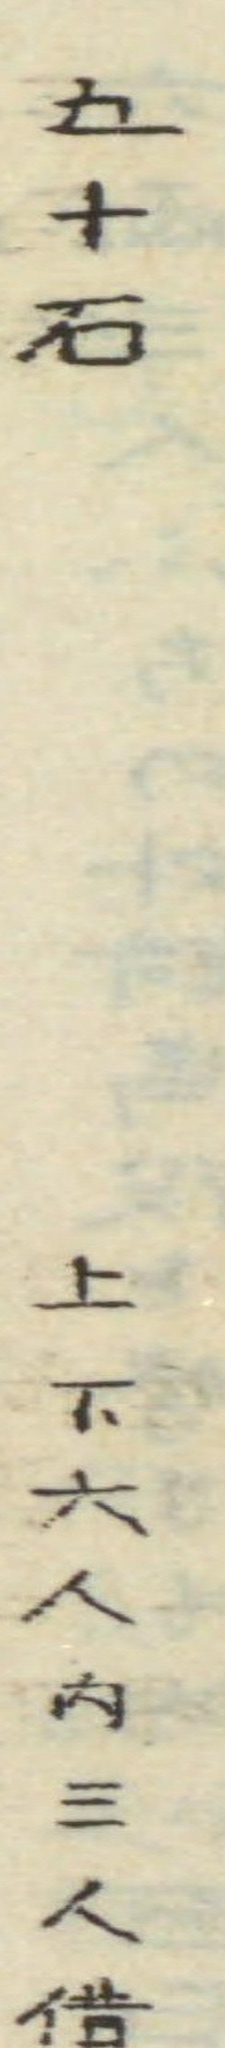五十石上下六人内三人借
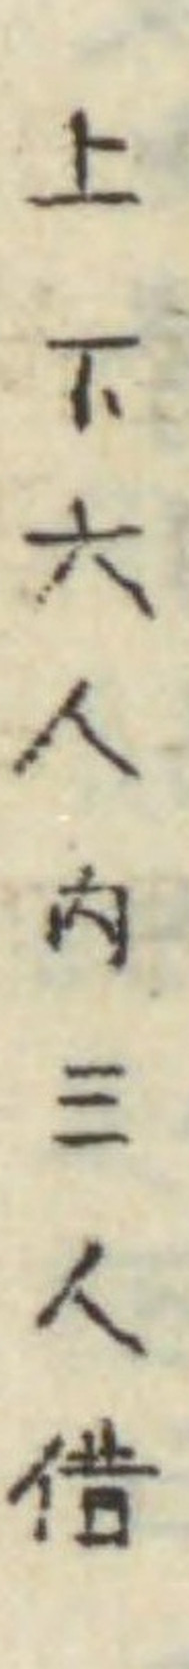上下六人内二人借
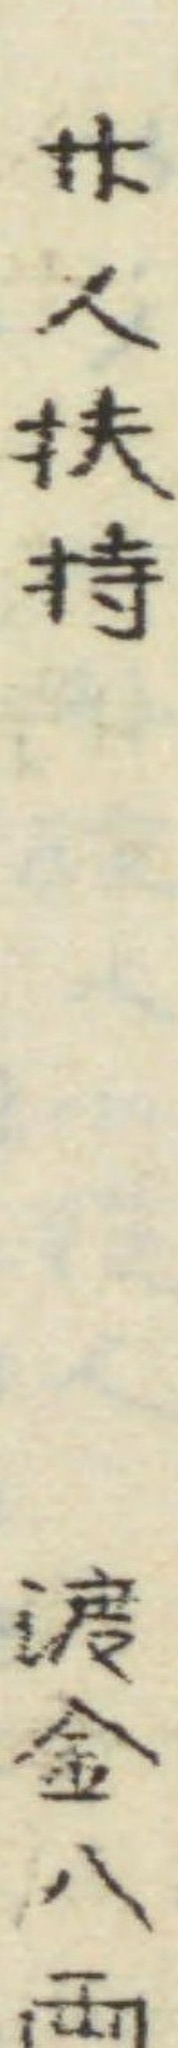廿人扶持渡金八両
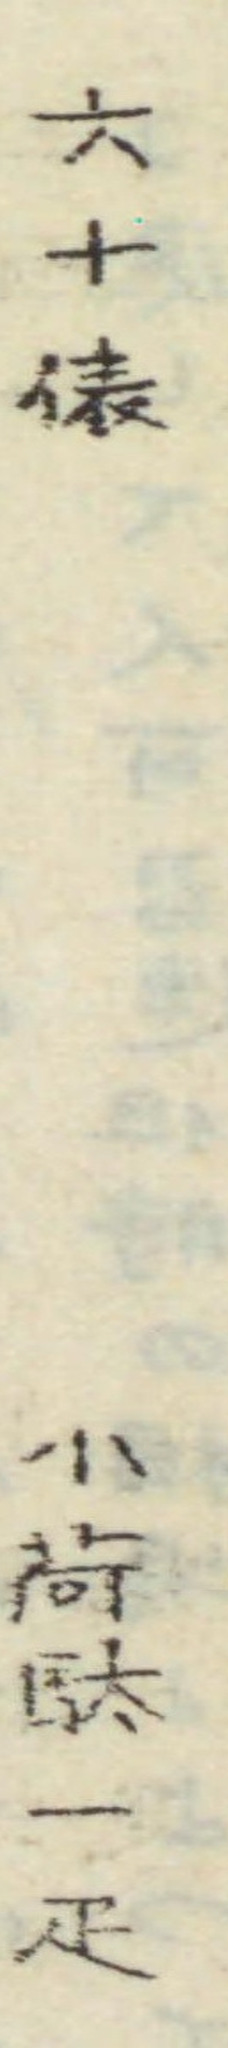六十俵小荷駄一疋
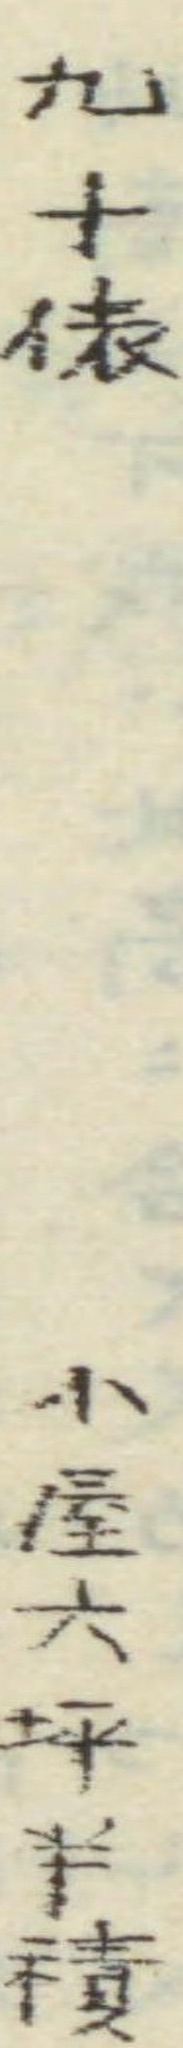九十俵小屋六坪半積
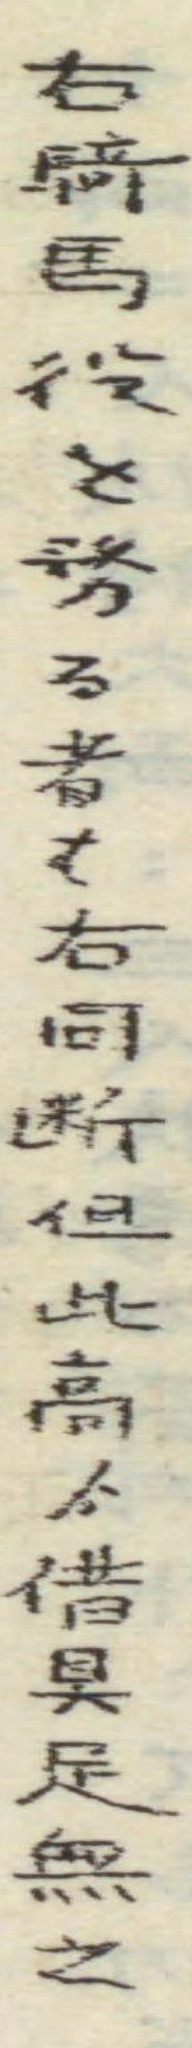右騎馬役を務る者は右同断但此高ゟ借具足無之
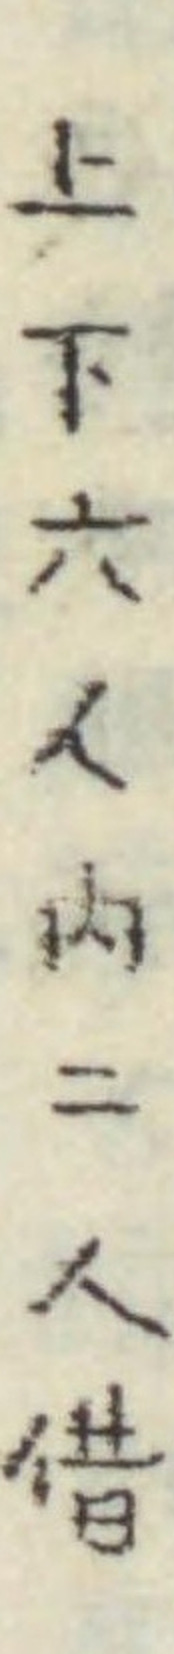上下六人内二人借
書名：三河吉田藩動員史料
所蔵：国立国会図書館 National Diet Library, JAPAN
